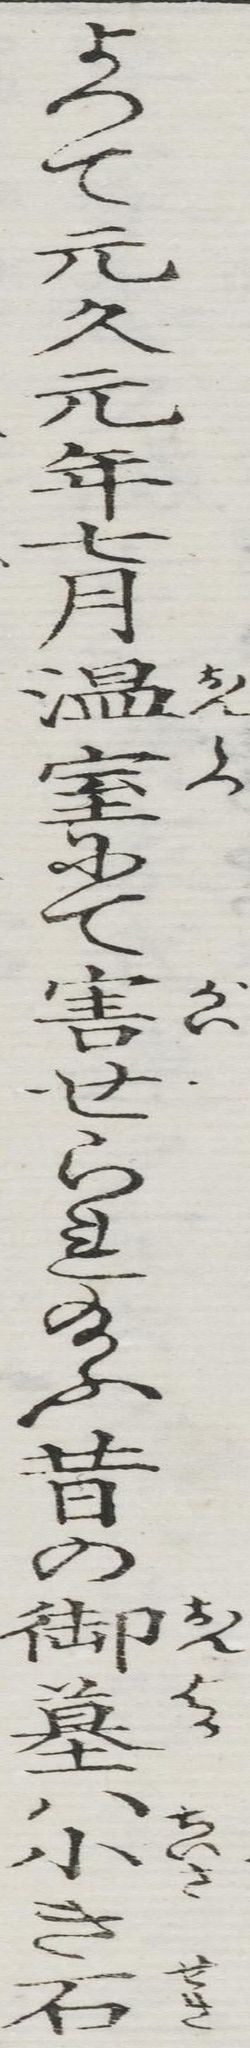よつて元久元年七月温室にて害せられ給ふ昔の御墓ハ小き石
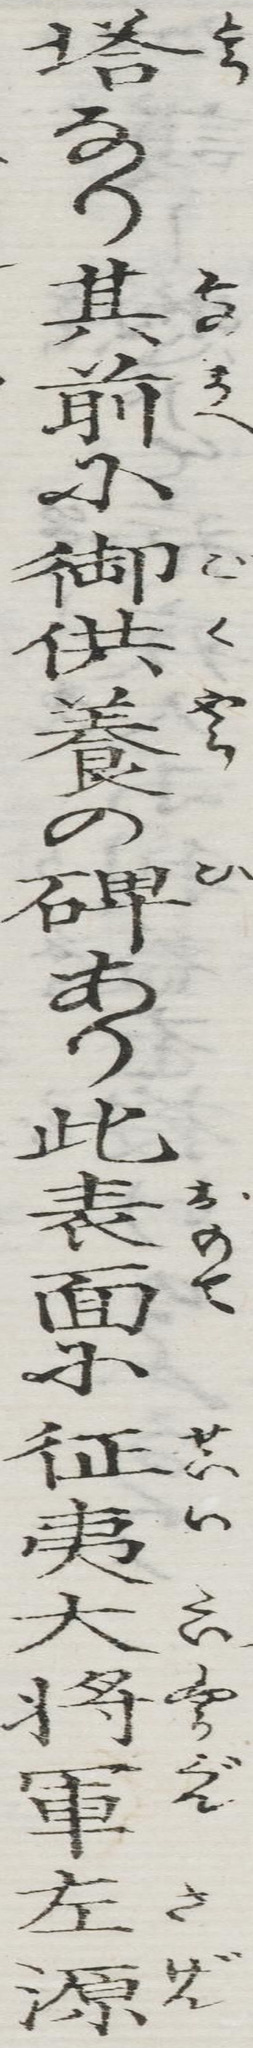塔なり其前に御供養の碑あり此表面に征夷大将軍左源
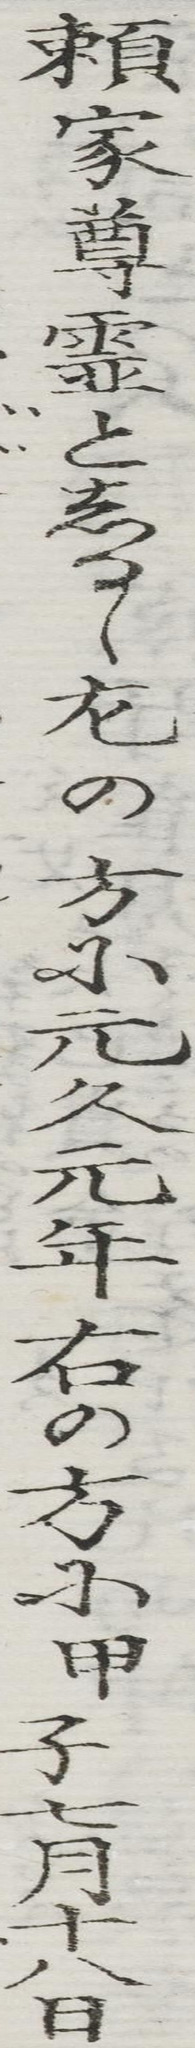頼家尊霊としるし左の方に元久元年右の方に甲子七月十八日
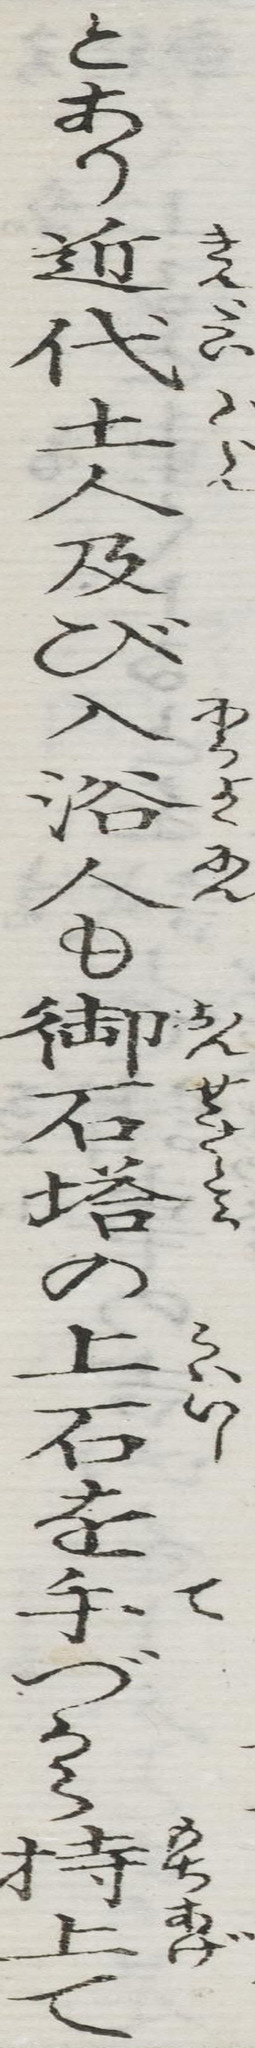とあり近代土人及び入浴人も御石塔の上石を手づから持上て

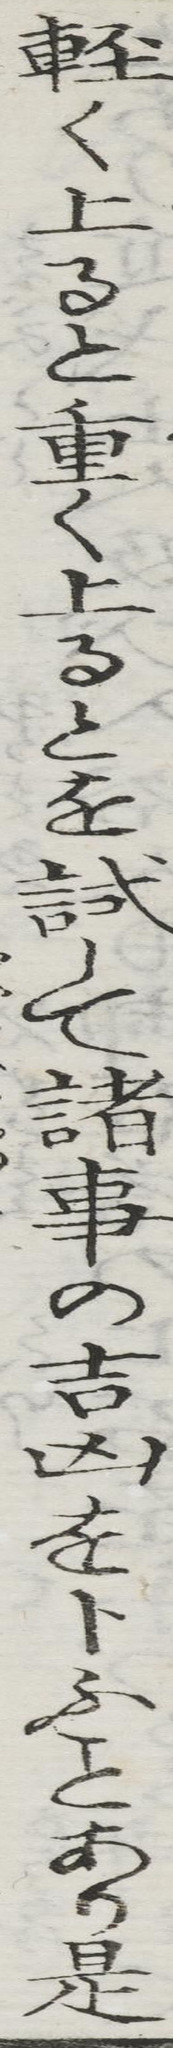軽く上ると重く上るとを試して諸事の吉凶を卜ふとあり是
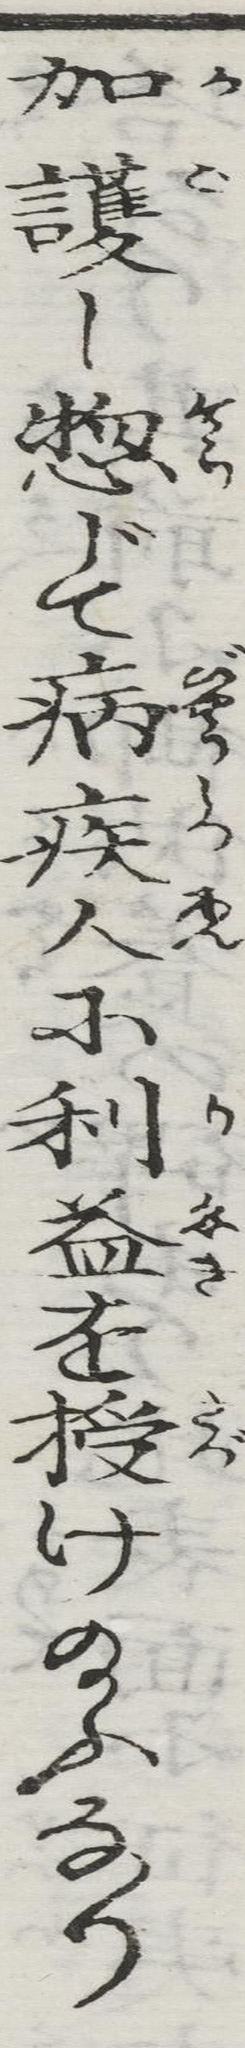加護し惣じて病疾人に利益を授け給ふなり
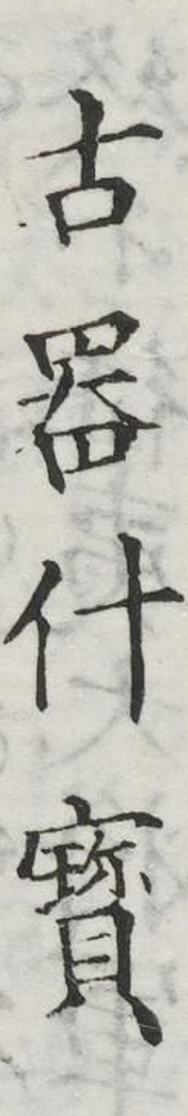古器什宝
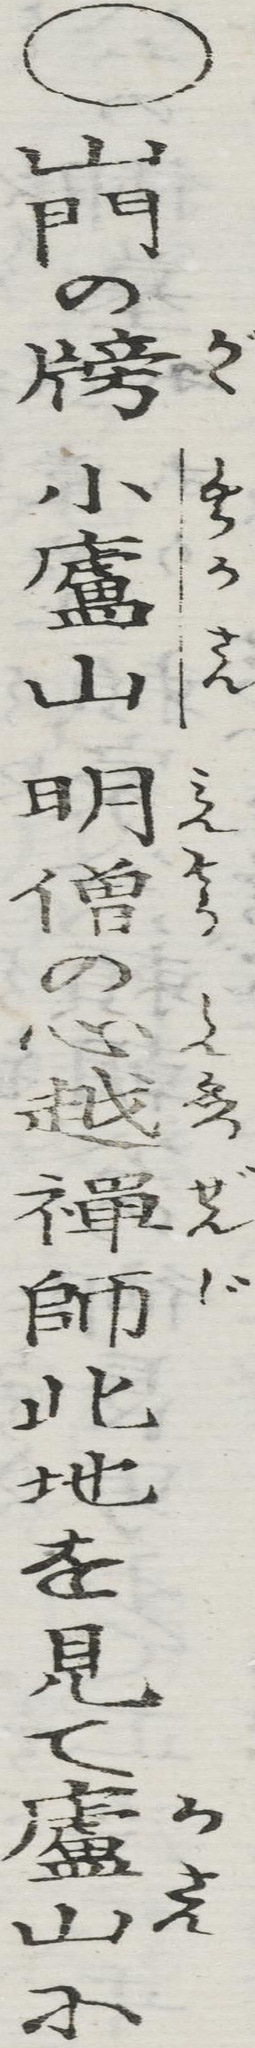○山門の牓小廬山明僧の心越禅師此地を見て廬山に
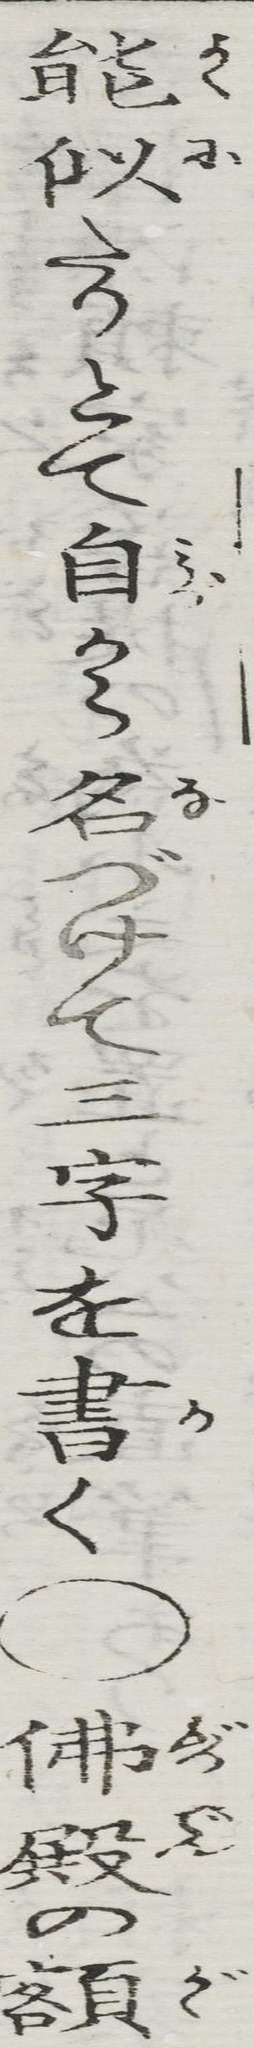能似たりとて自から名づけて三字を書く○佛殿の額
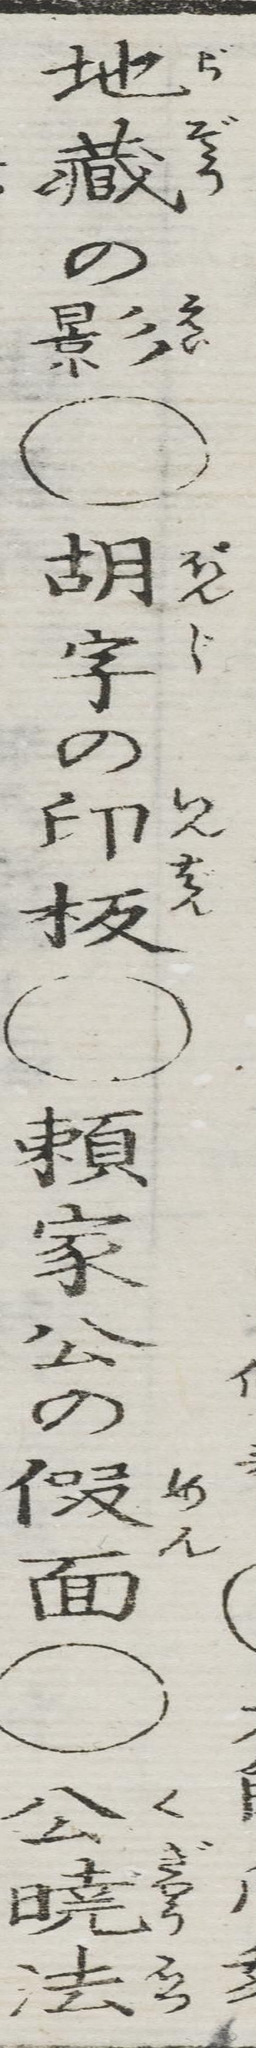地蔵の影○胡字の印板○頼家公の仮面○公暁法
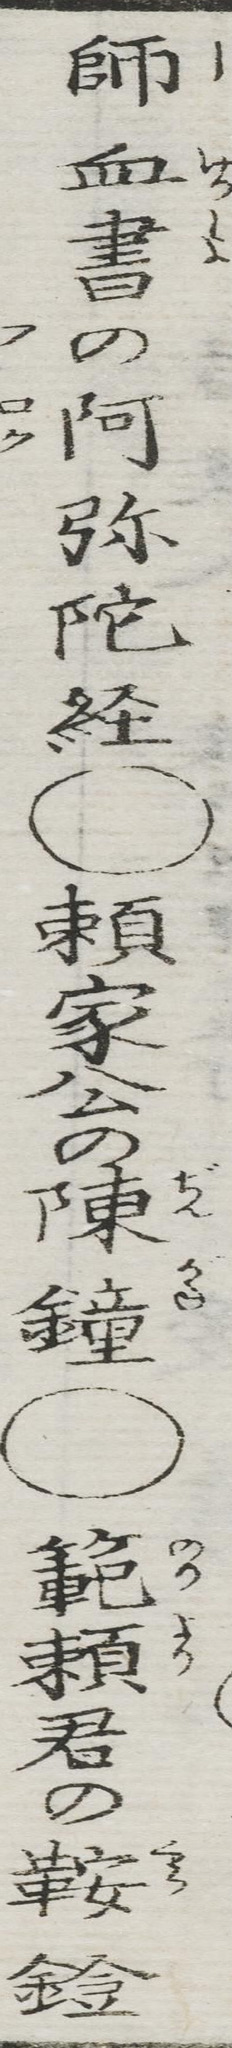師血書の阿弥陀経○頼家公の陳鐘○範頼君の鞍鐙
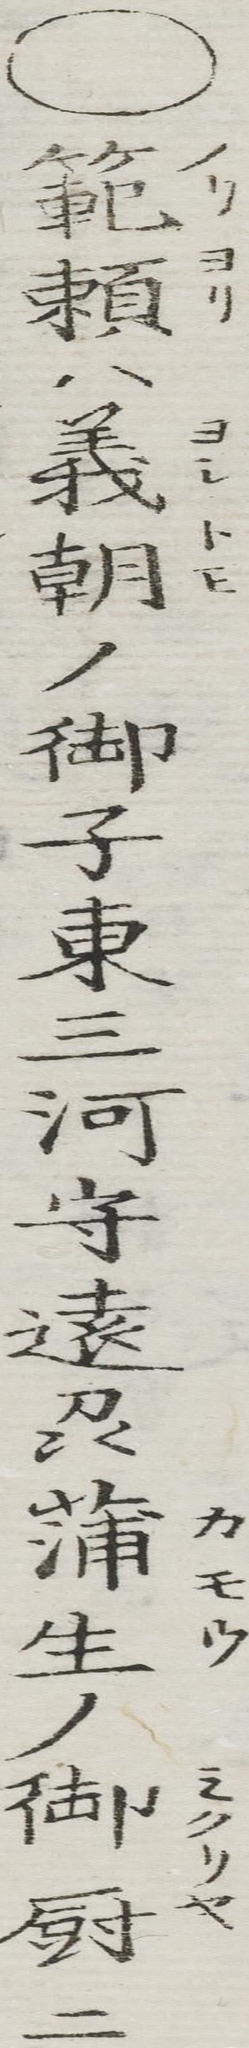○範頼ハ義朝ノ御子東三河守遠州蒲生ノ御厨ニ
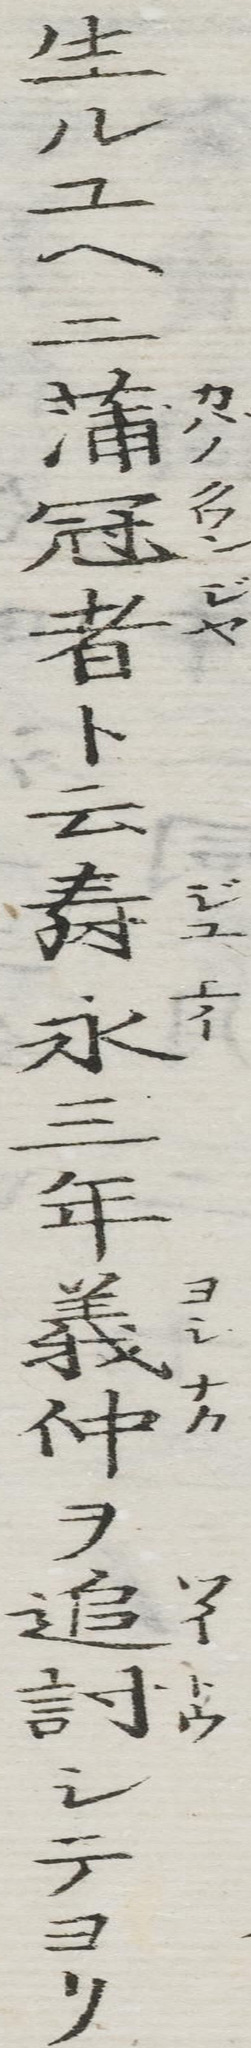生ルユヘニ蒲冠者ト云寿永三年義仲ヲ追討シテヨリ
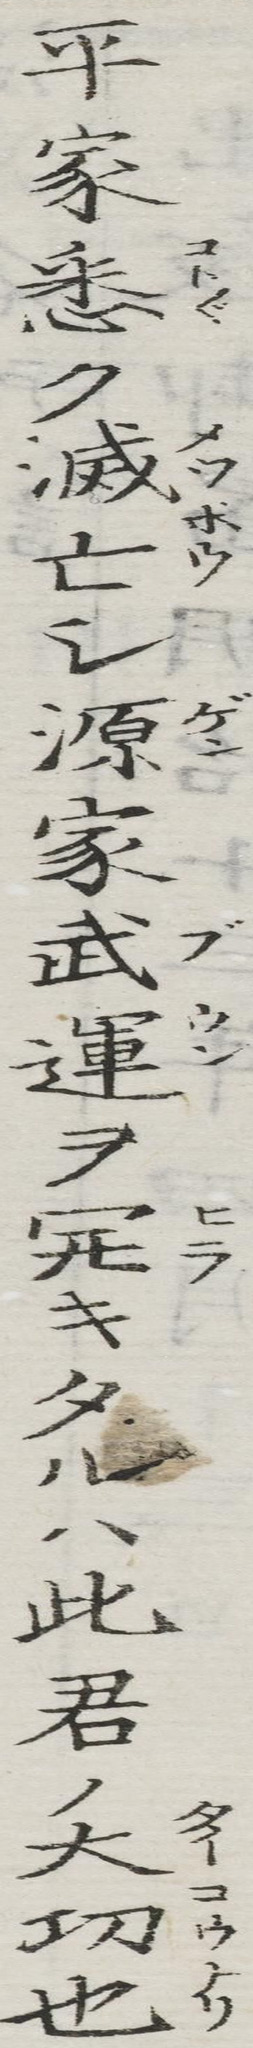平家悉ク滅亡シ源家武運ヲ開キタルハ此君ノ大功也
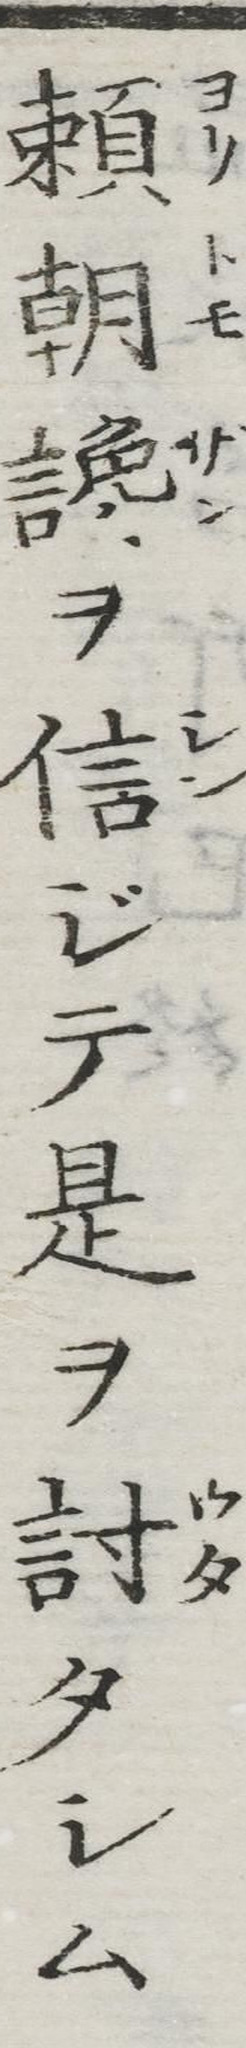頼朝讒ヲ信ジテ是ヲ討タシム
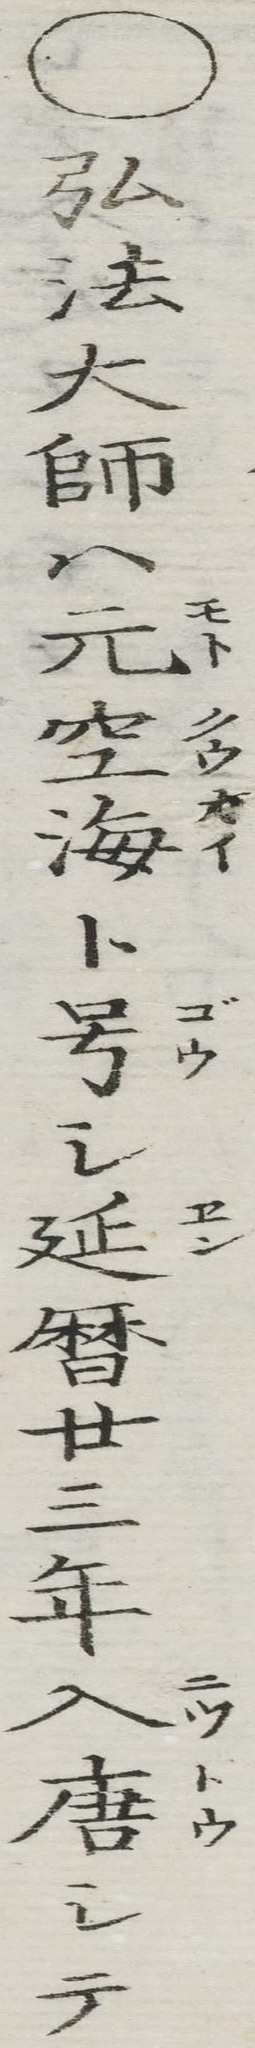○弘法大師ハ元空海ト号シ延暦廿三年入唐シテ
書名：伊豆国修善寺温泉名所記　全
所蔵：東京大学地震研究所図書室 Earthquake Research Institute Library, The University of Tokyo, JAPAN
